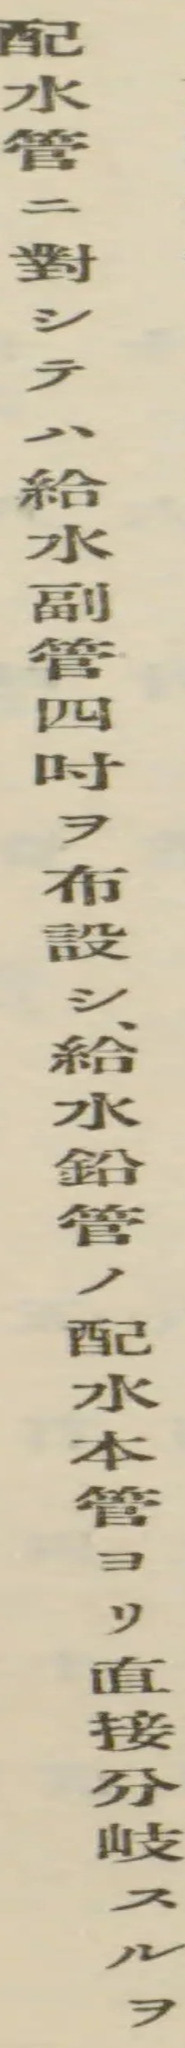配水管に対しては給水副管四吋を布設し、給水鉛管の配水本管より直接分岐するを

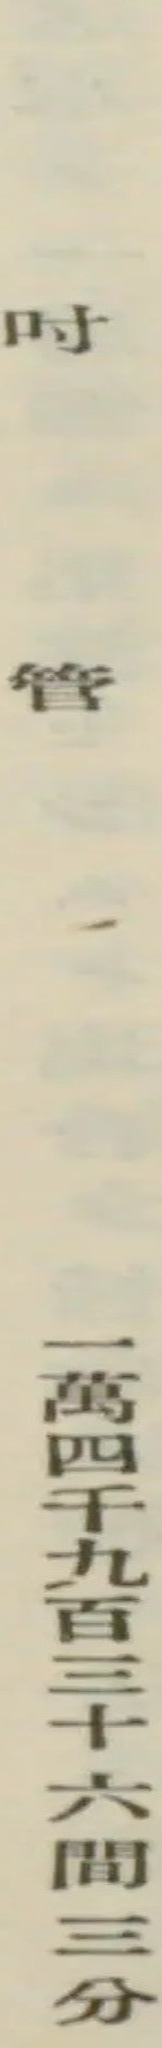三吋管一萬四千九百三十六間三分
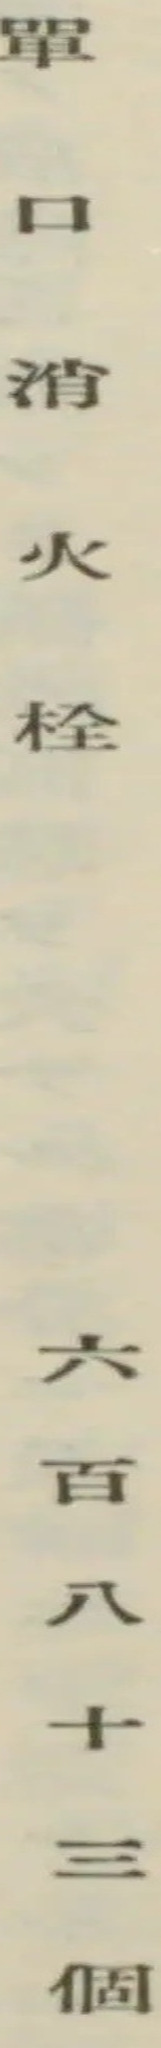単口消火栓六百八十三個
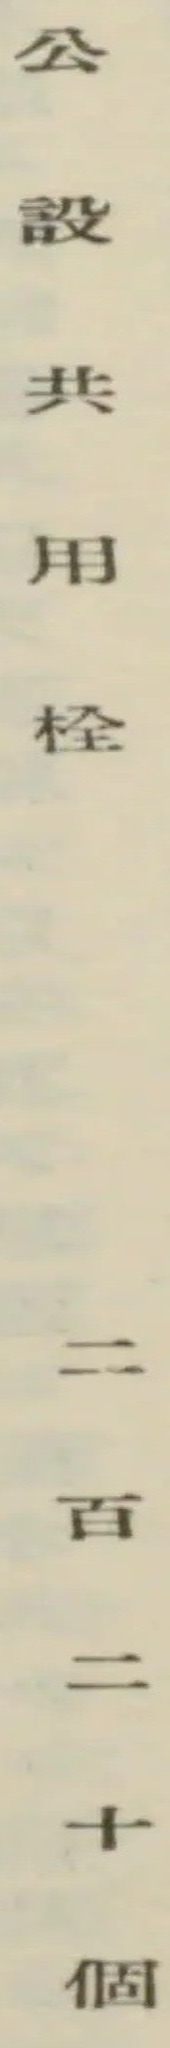公設共用栓二百二十個
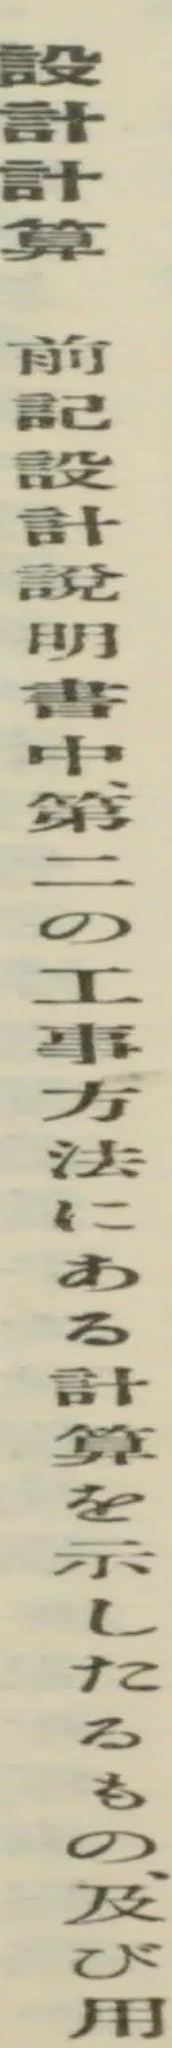設計計算前記設計説明書中、第二の工事方法にある計算を示したるもの、
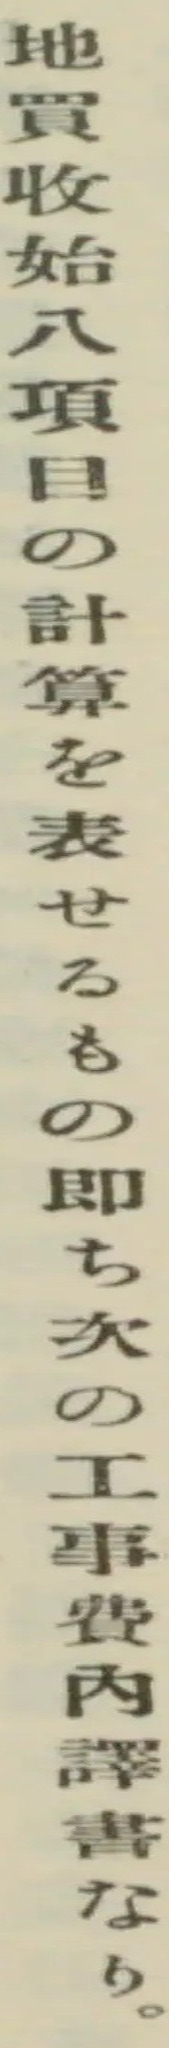地買収始八項目の計算を表せるもの即ち次の工事費打ち分け内譯書なり。
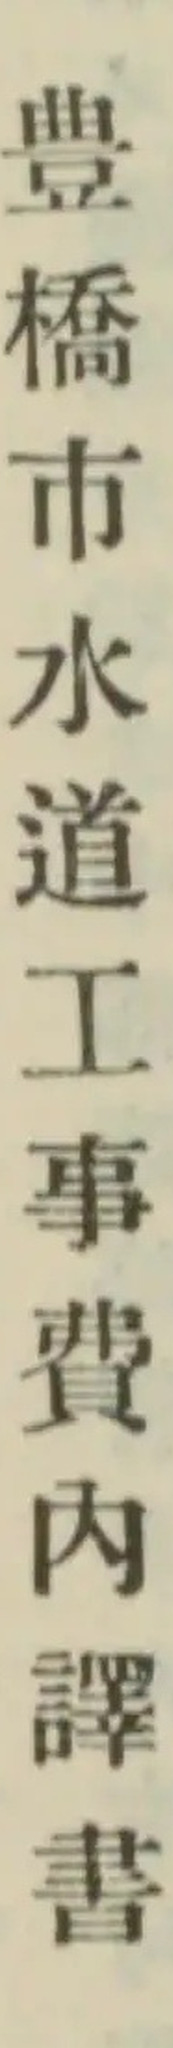豊橋市水道工事費内譯書
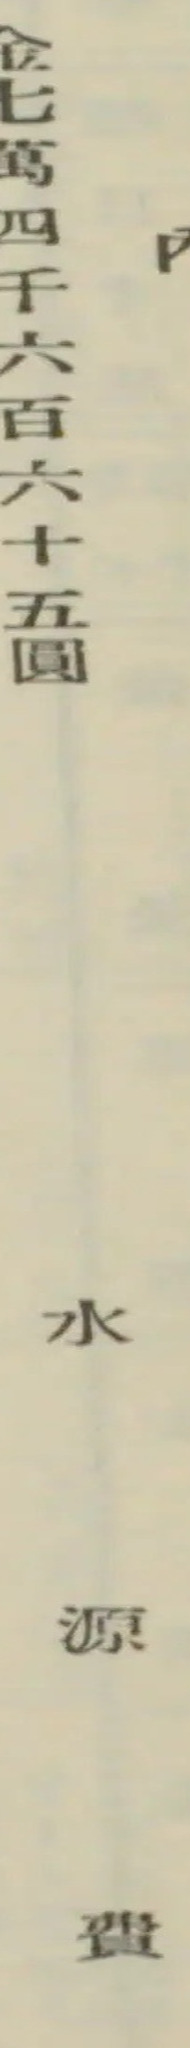金七萬四千六百六十五円水源費
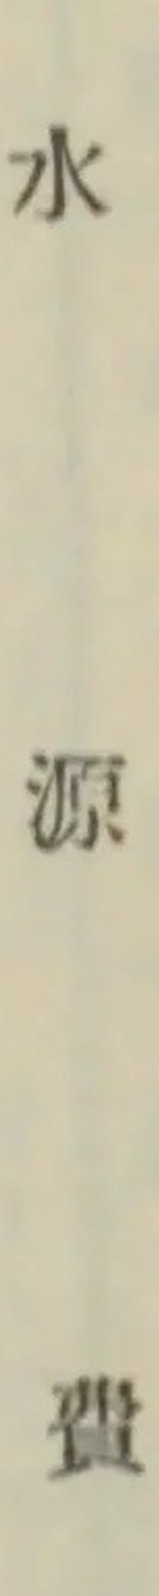水源費
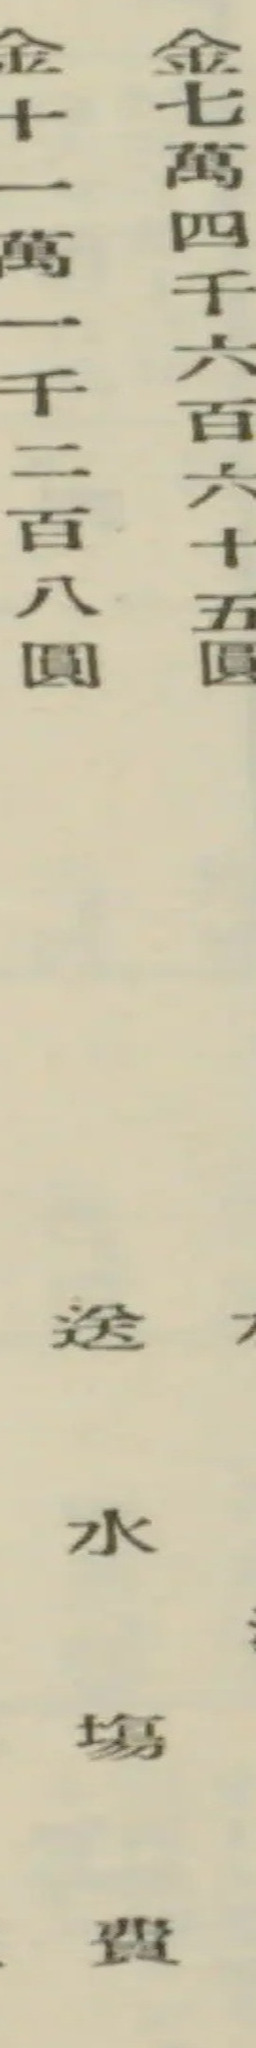金十一萬一千二百八円送水場費
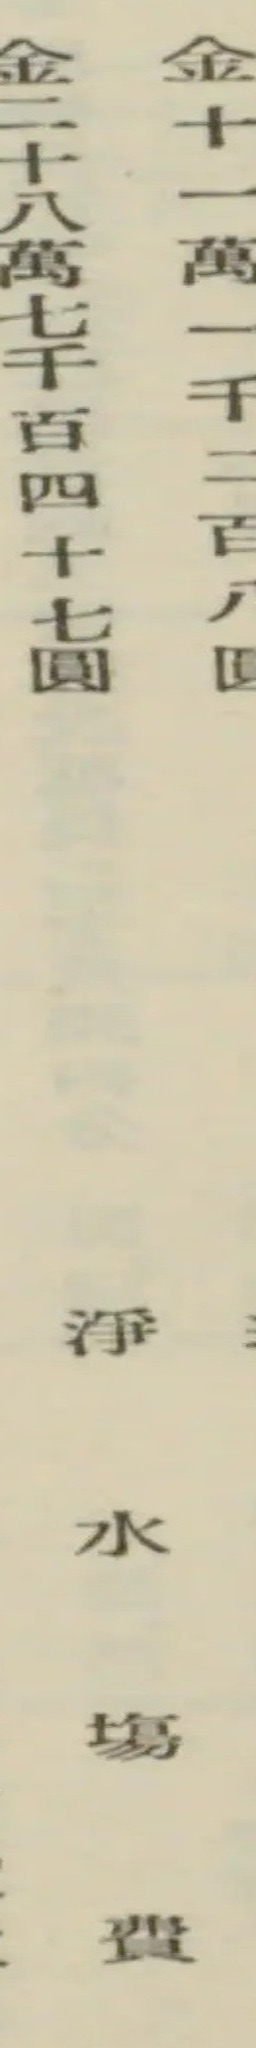金二十八萬七千百四十七円浄水場費
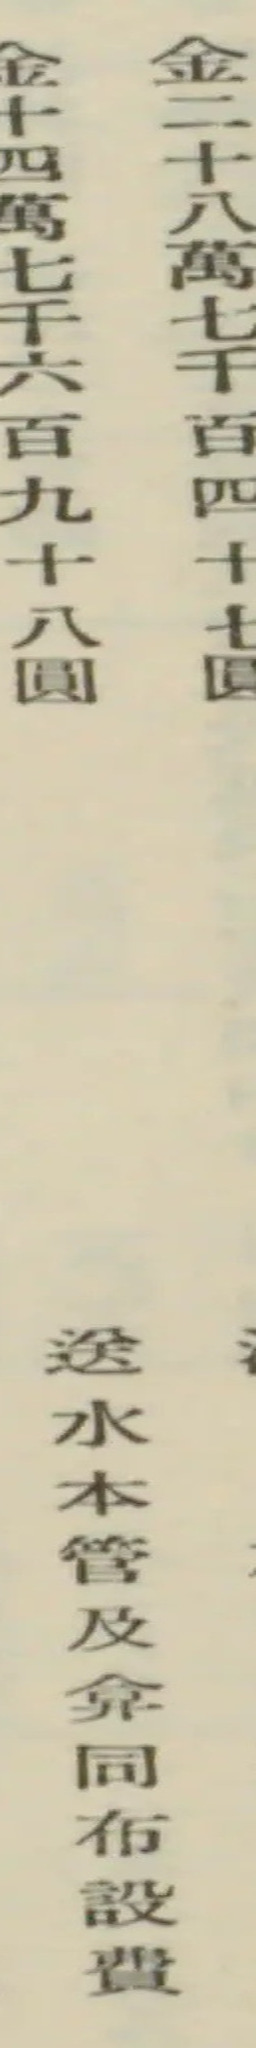金十四萬七千六百九十八円送水本管及弇同布設費
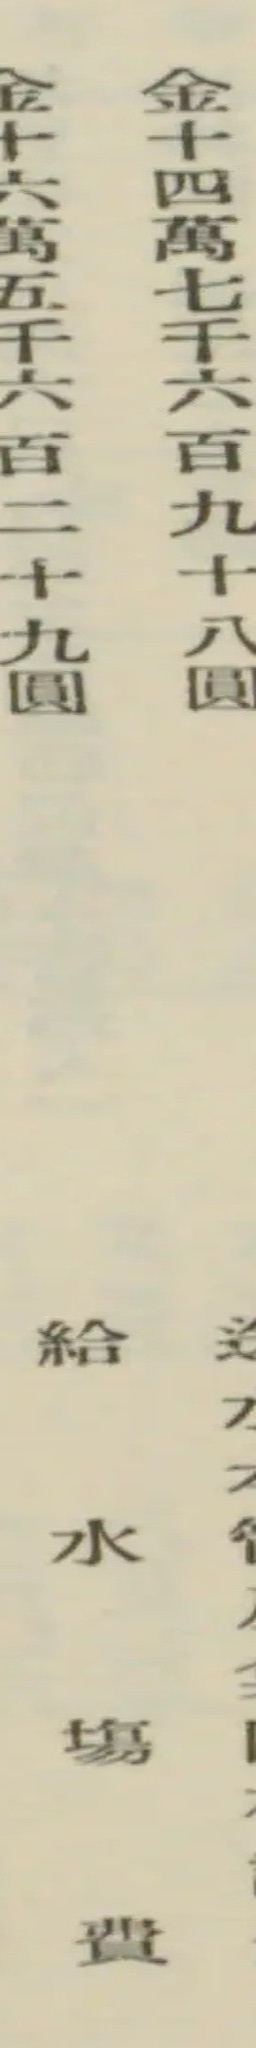金十六萬五千六百二十九円給水場費
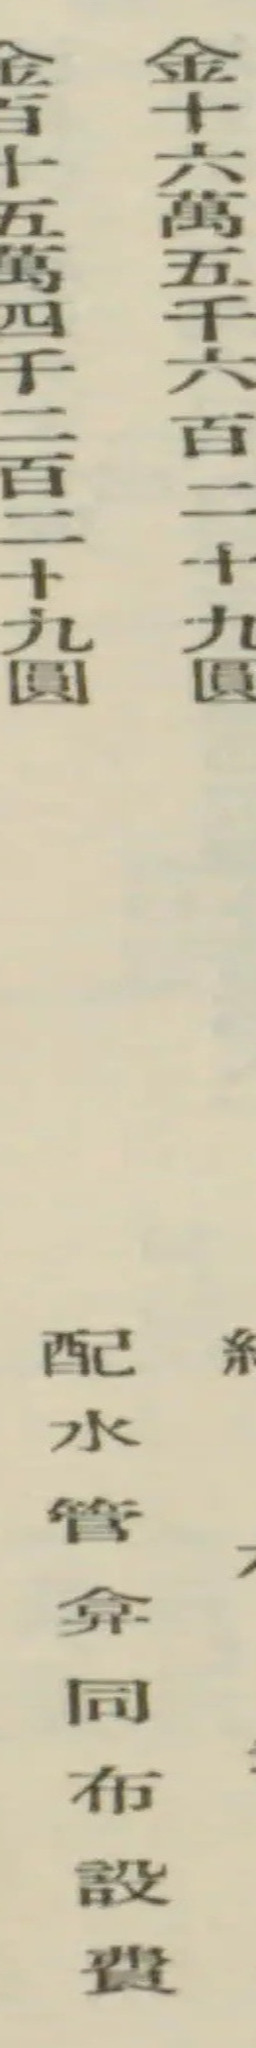金百十五萬四千二百二十九円配水管弇同布設費
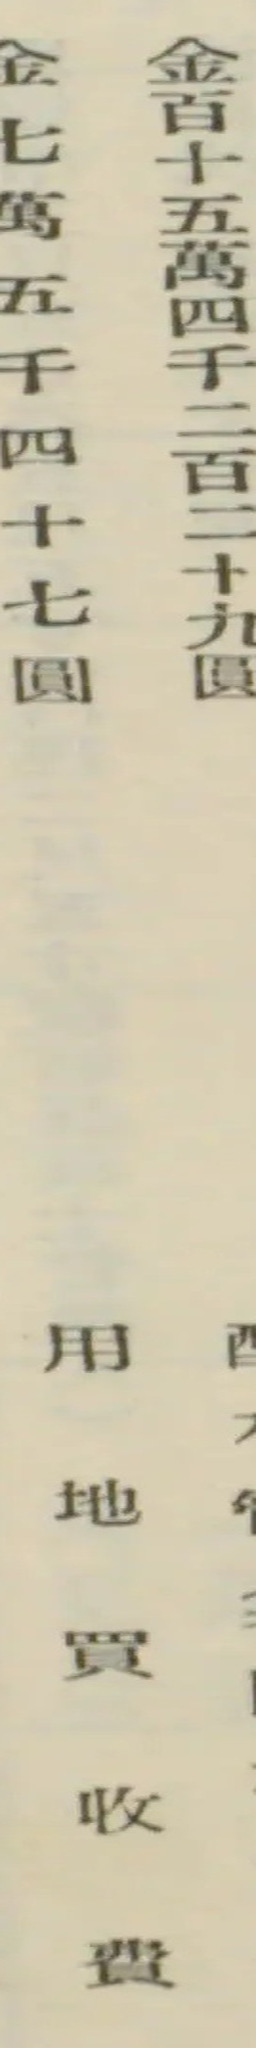金七萬五千四十七円用地買収費
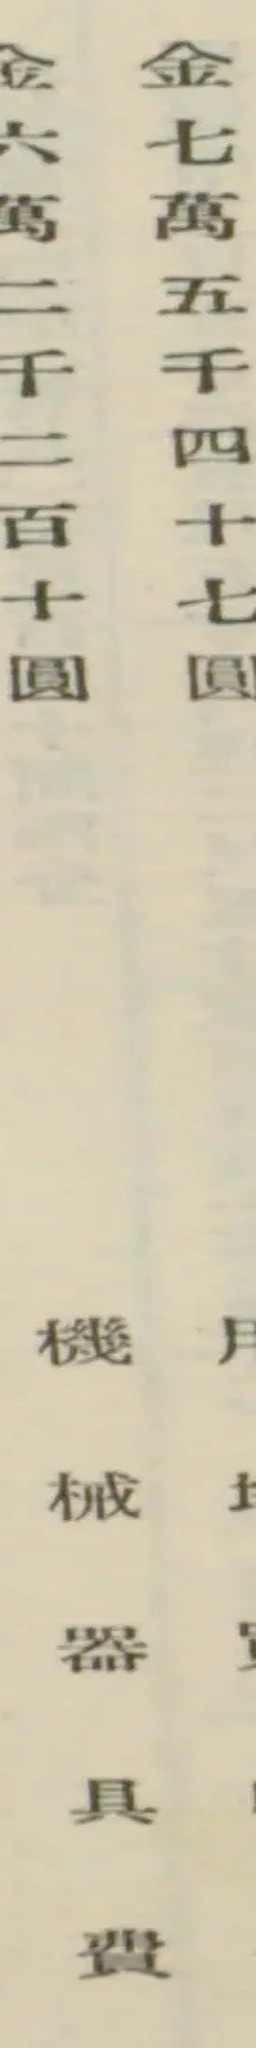金六萬二千二百十円機械器具費
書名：豊橋市水道誌
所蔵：国立国会図書館 National Diet Library, JAPAN
